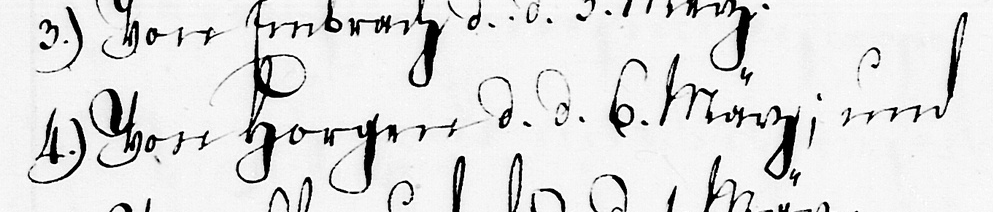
4.) Von Horgen d. d. 6. März; und
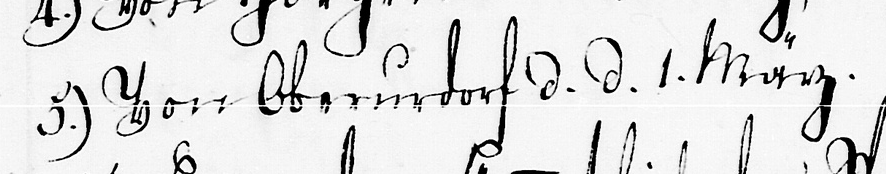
5.) Von Oberurdorf d. d. 1. März.
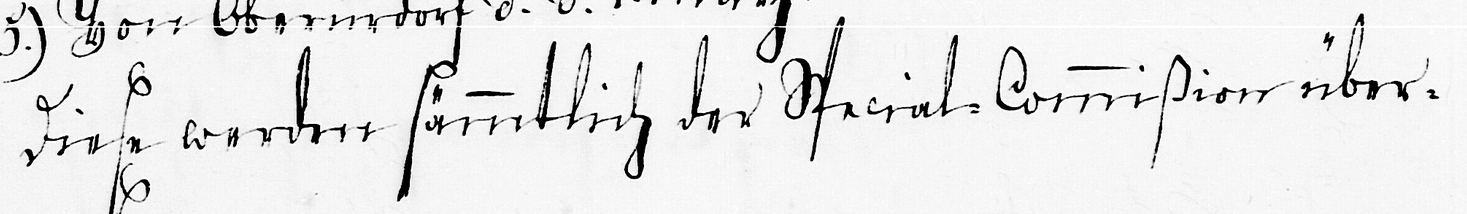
Diese werden sämmtlich der Special-Commißion über¬
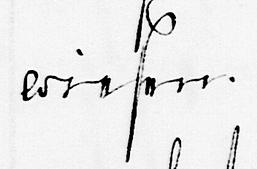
wiesen.
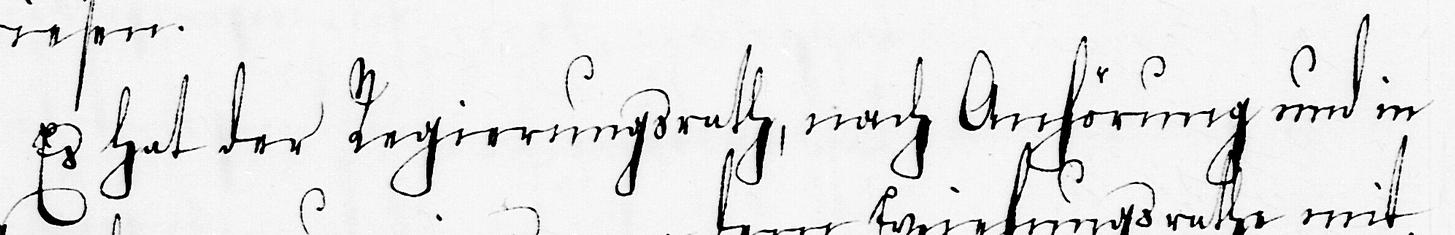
Es hat der Regierungsrath, nach Anhörung und in
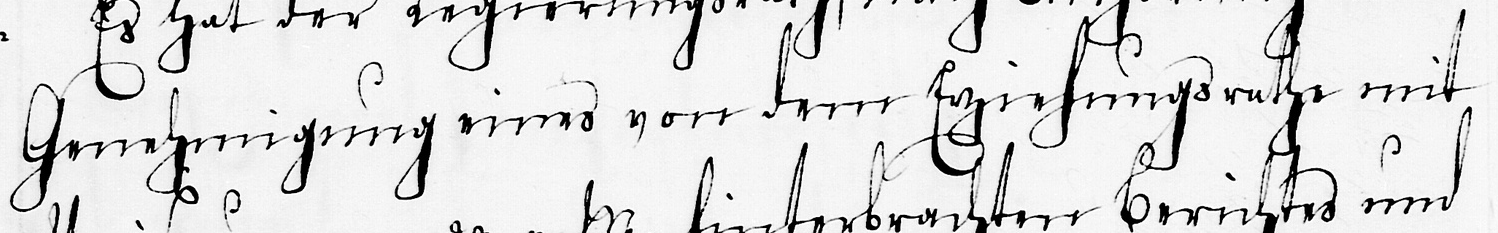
Genehmigung eines von dem Erziehungsrathe mit
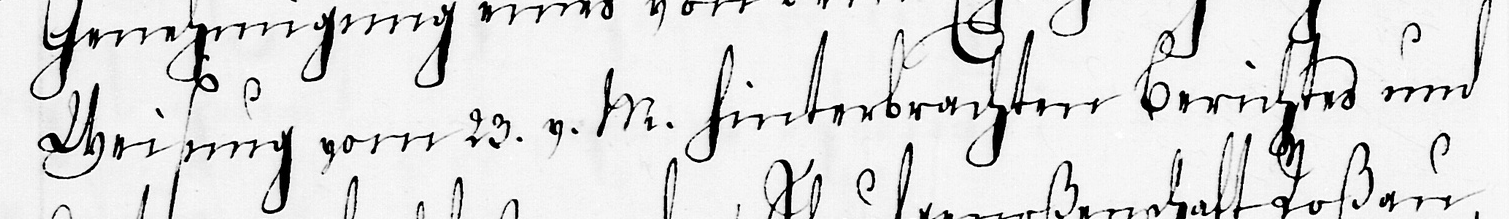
Weisung vom 23. v. M. hinterbrachten Berichtes und
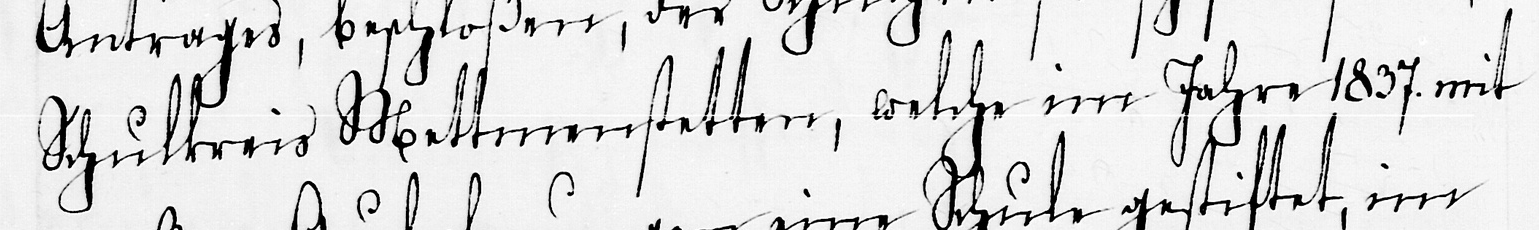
Schulkreis Mettmenstetten, welche im Jahre 1837. mit
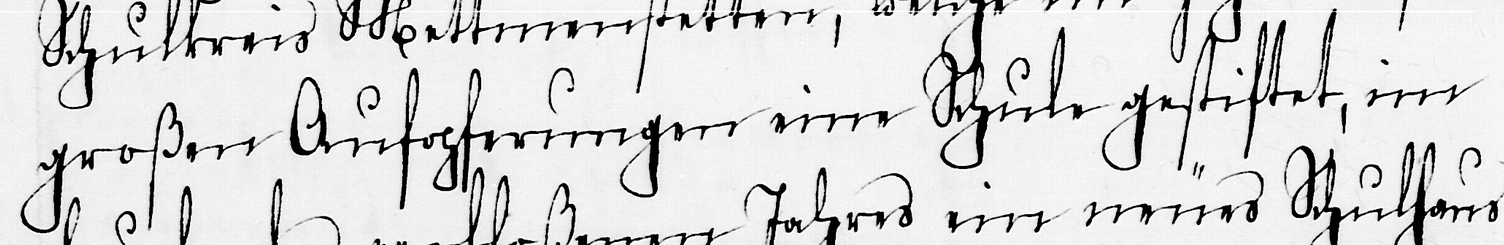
großen Aufopferungen eine Schule gestiftet, im
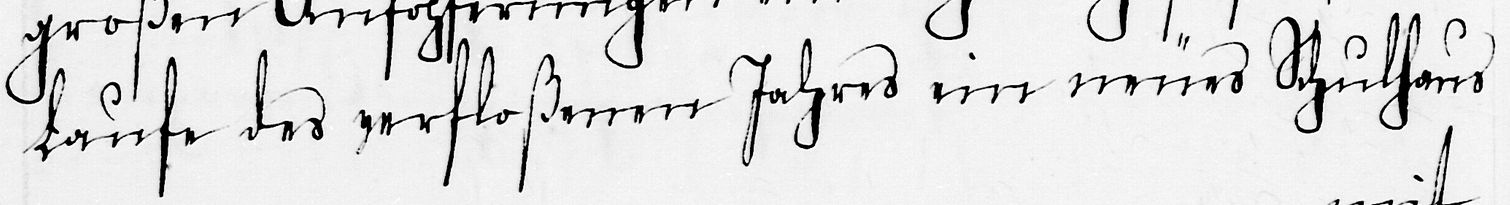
Laufe des verfloßenen Jahres ein neues Schulhaus
